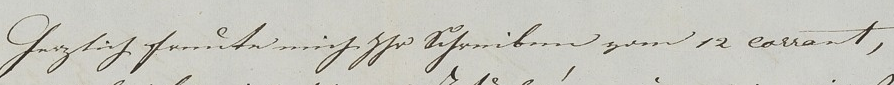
Herzlich freute mich Ihr Schreiben vom 12 corrant,
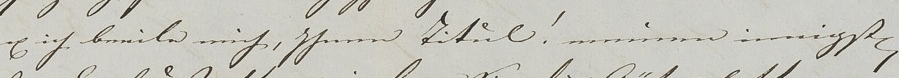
& ich beeile mich, Ihnen Titul! meinen innigsten
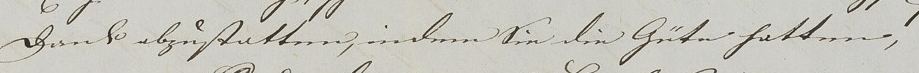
Dank abzustatten, indem Sie die Güte hatten,
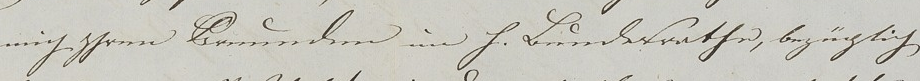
mich Ihren Freunden im h. Bundesrathe, bezüglich
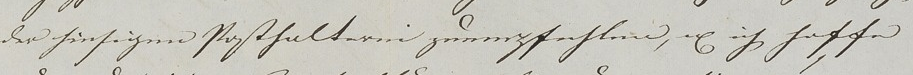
der hiesigen Posthalterei zuempfehlen, & ich hoffe
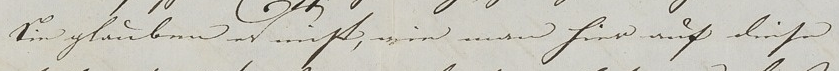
Sie glauben es nicht, wie man hier auf diese
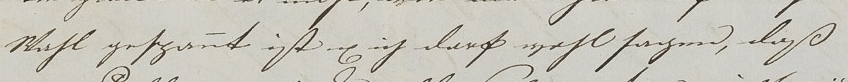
Wahl gespannt ist & ich darf wohl sagen, daß
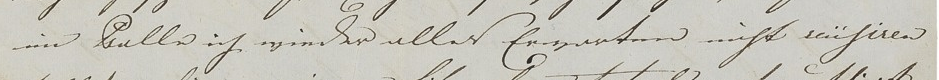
im Falle ich wieder alles Erwarten nicht reüssiren
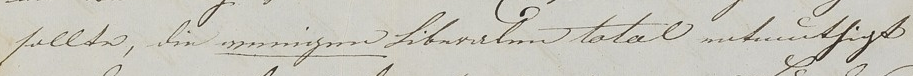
sollte, die wenigen Liberalen total entmuthigt
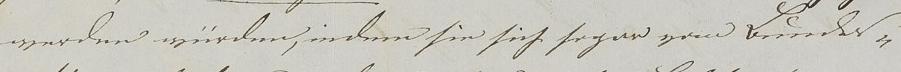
werden würden, indem sie sich sogar vom Bundes-
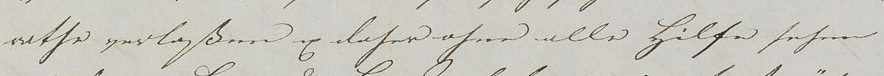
rathe verlaßen & daher ohne alle Hilfe sehen
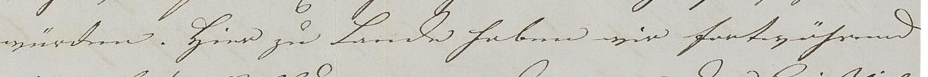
würden. Hier zu Lande haben wir fortwährend
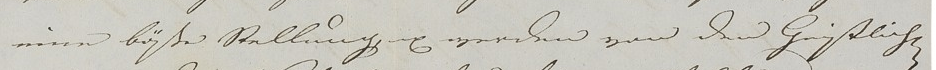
eine böße Stellung, & werden von den Geistlichen
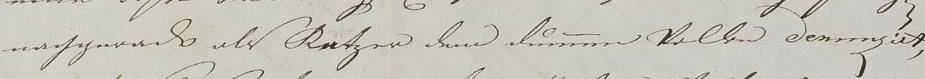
nachgerade als Ketzer dem dummen Volke denunzirt,
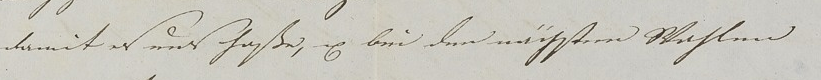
damit es uns haße, & bei den nächsten Wahlen
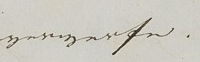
verwerfe.
